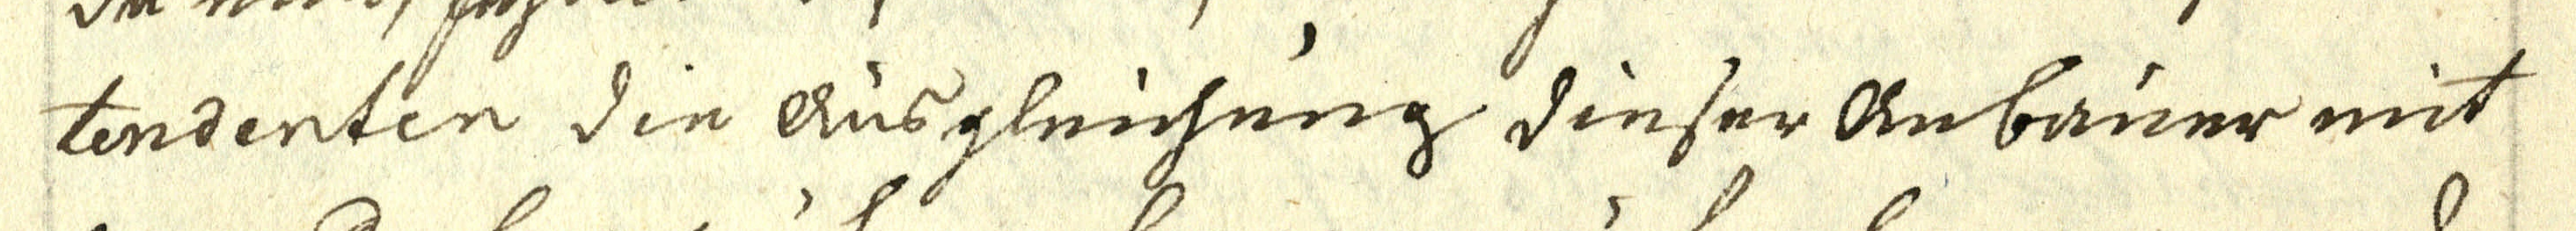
tendenten die Ausgleichung dieser Anbauer mit
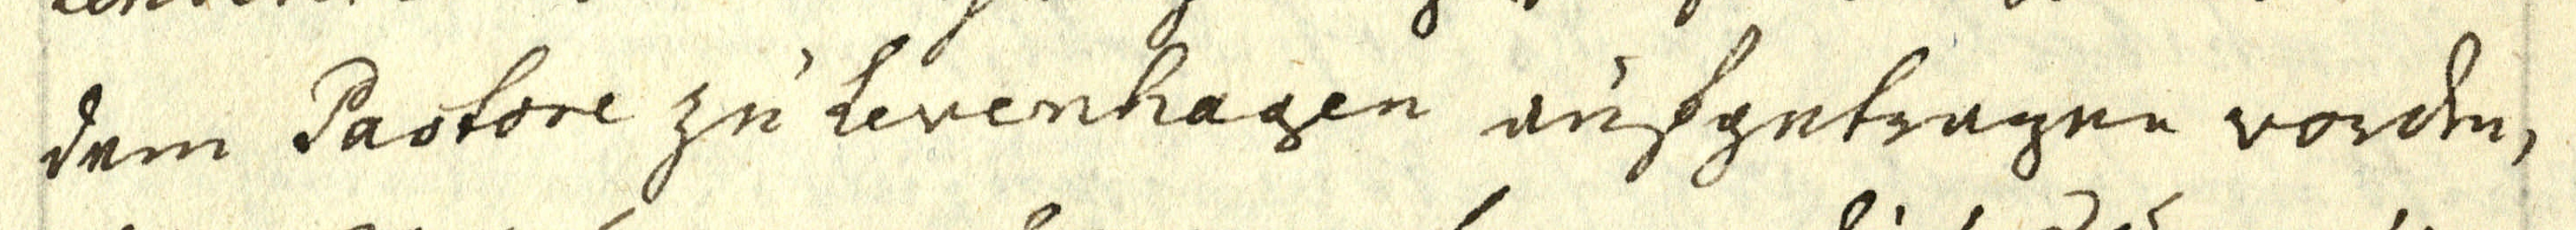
dem Pastore zu Levenhagen aufgetragen worden,
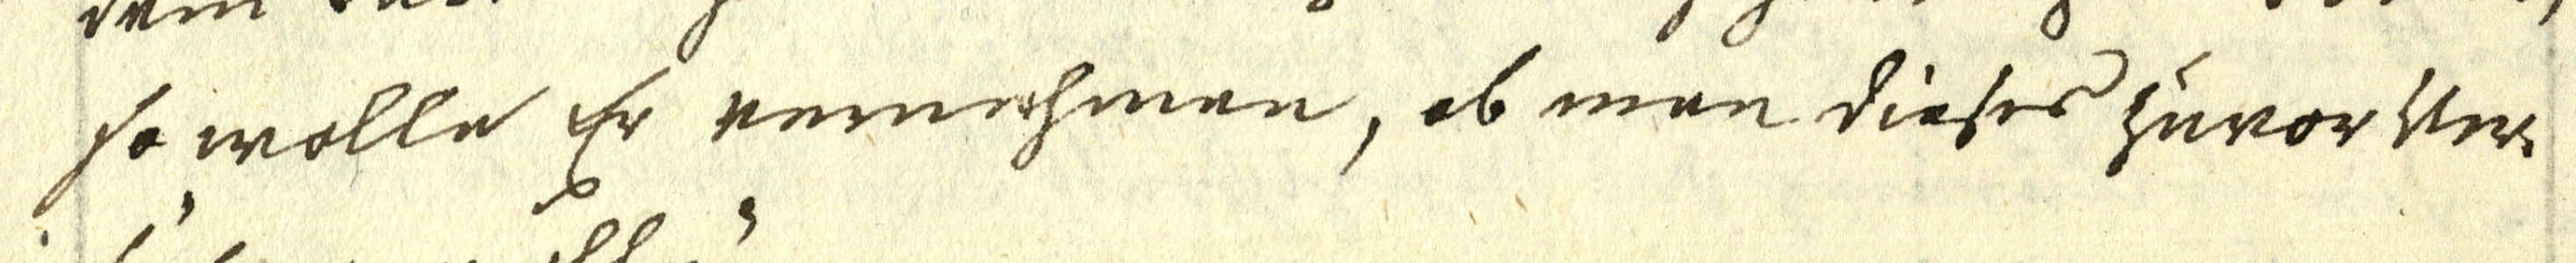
so wolle Er vernehmen ob man dieses zuvor ver¬
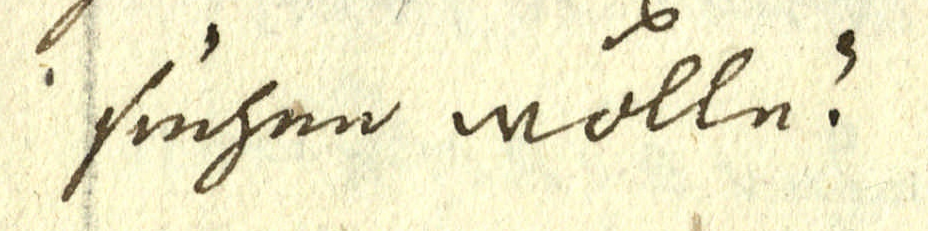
suchen wolle?
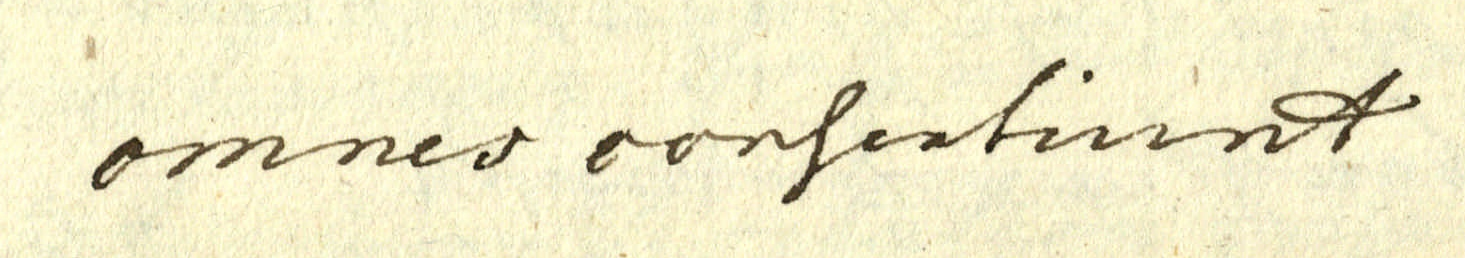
omnes consentiunt
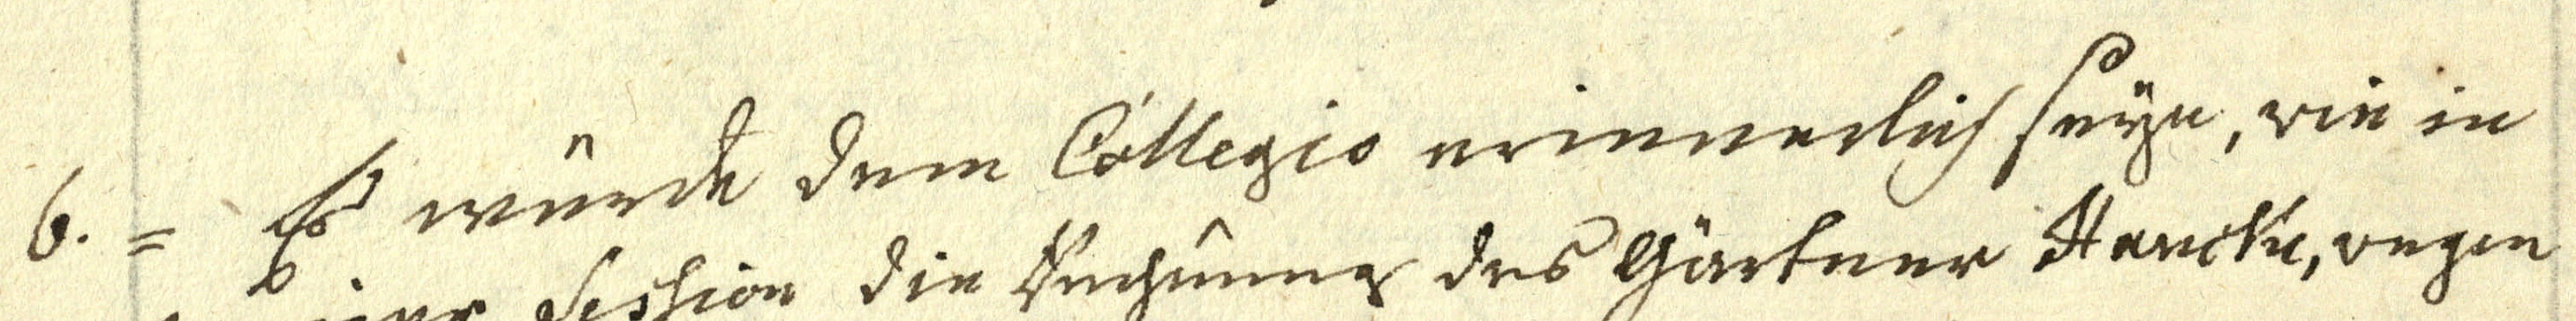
6. Es würde dem Collegio erinnerlich seÿn, wie in
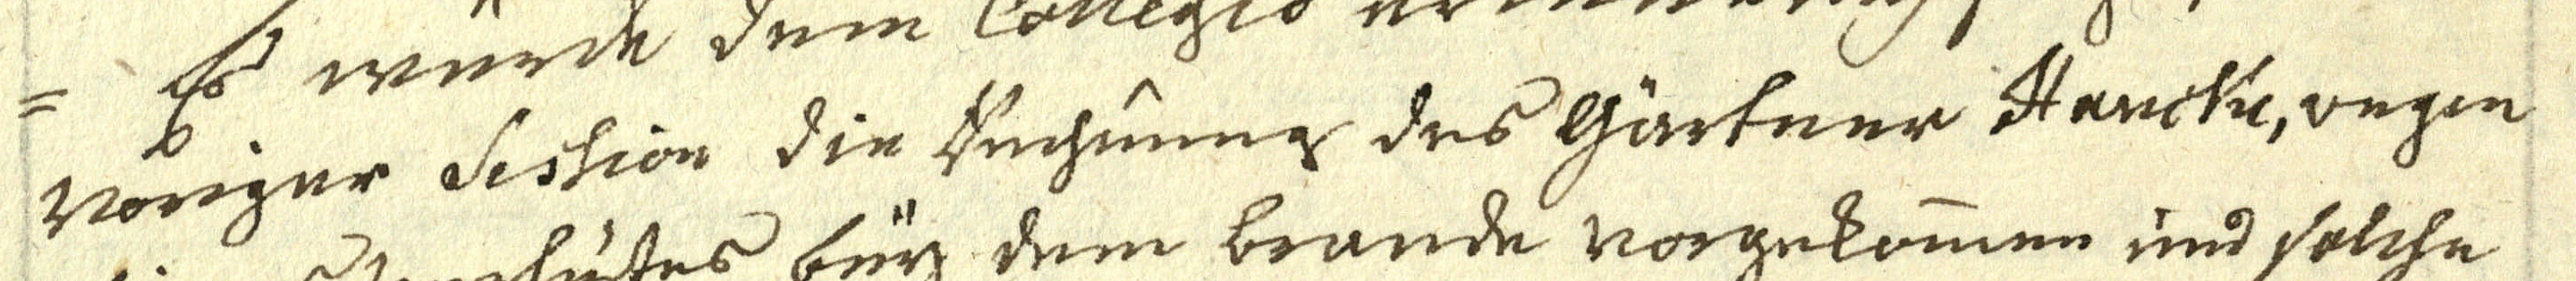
voriger Session die Rechnung des Gärtner Hancke, wegen
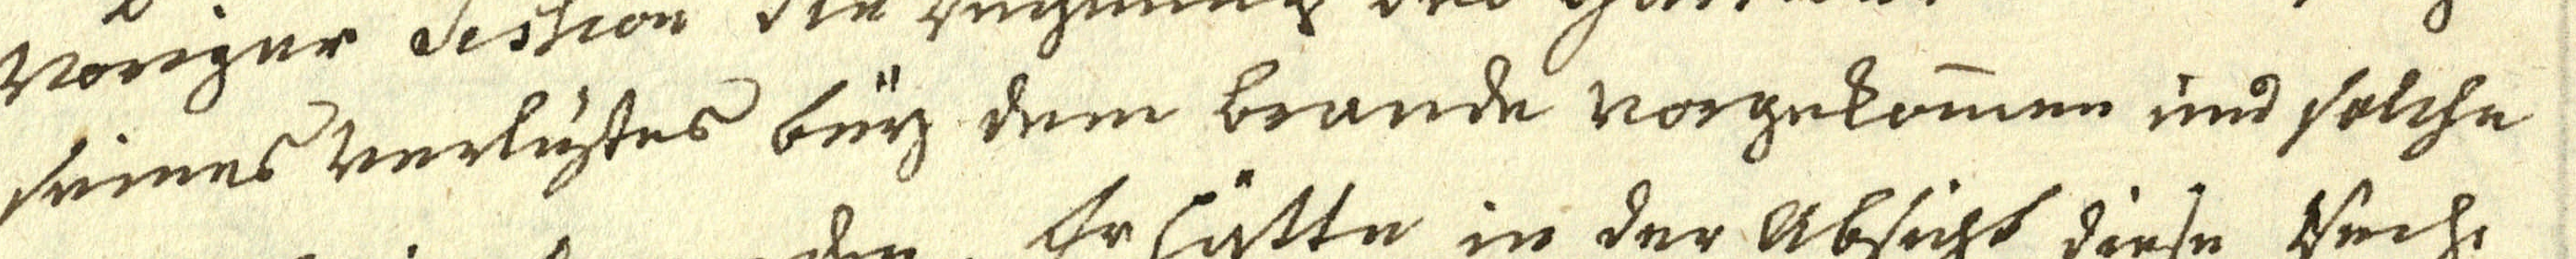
seines Verlustes beÿ dem Brande vorgekomen und solche
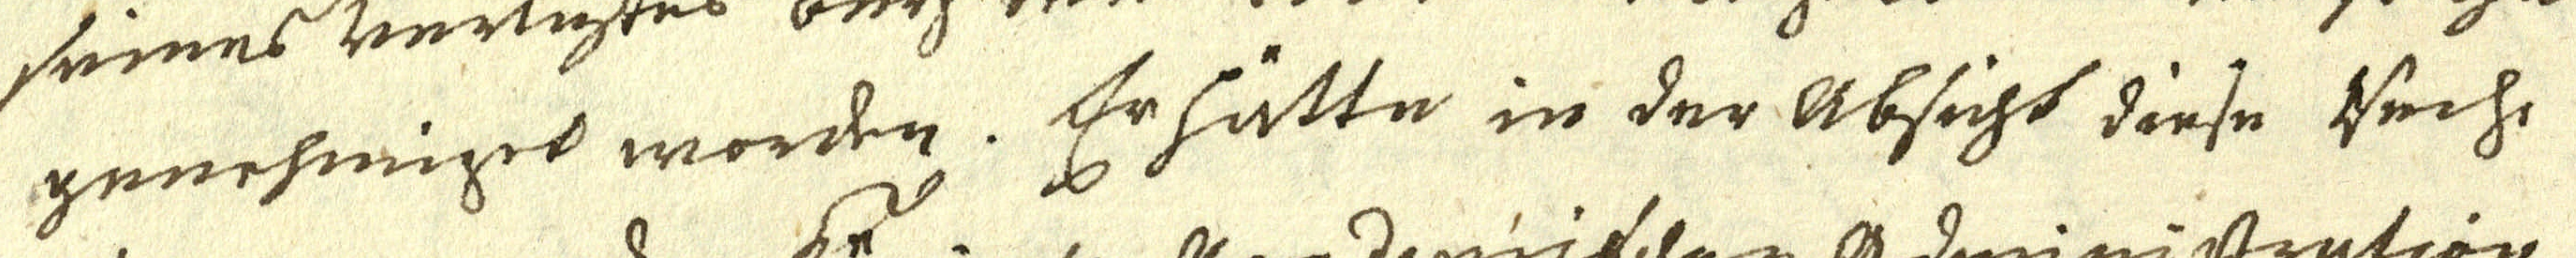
genehmiget worden. Er hätte in der Absicht diese Rech¬
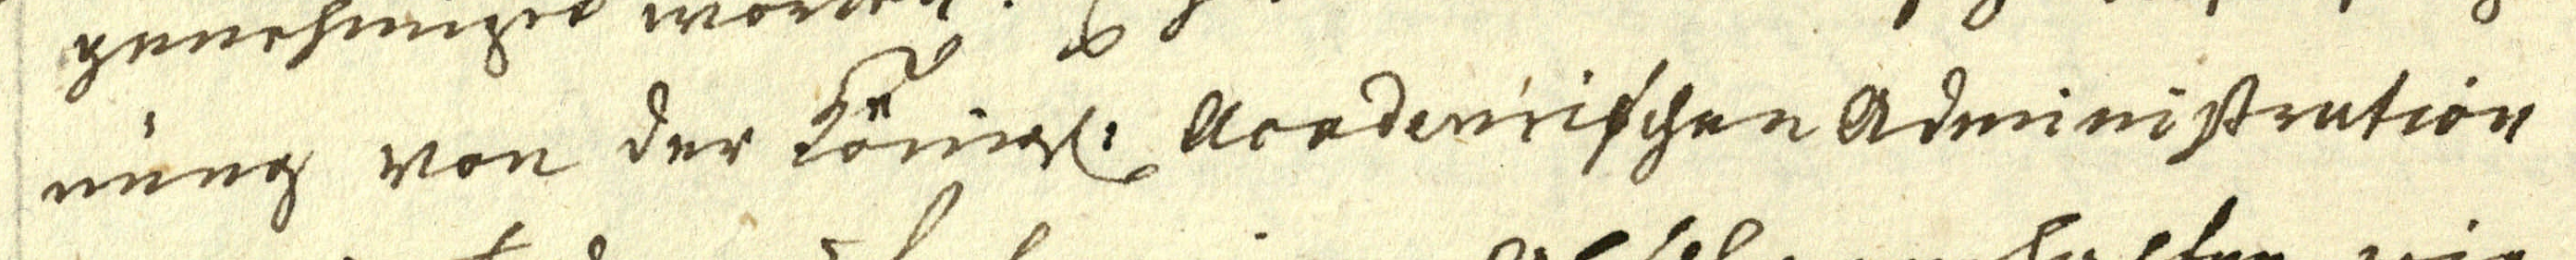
nung von der Königl. Academischen Administration
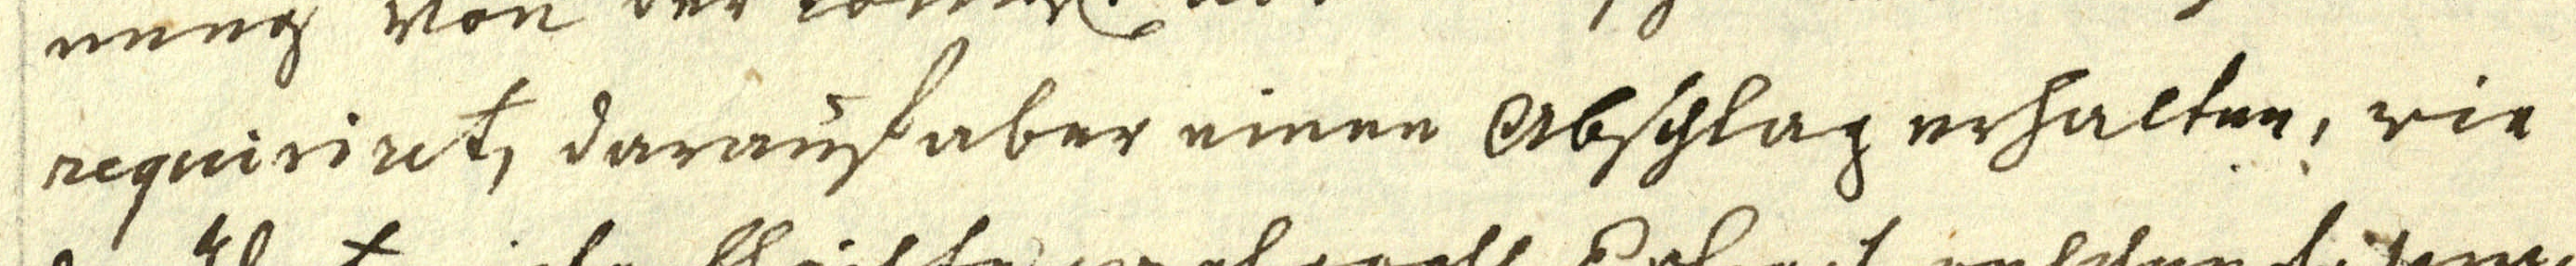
requiriret, darauf aber einen Abschlag erhalten, wie
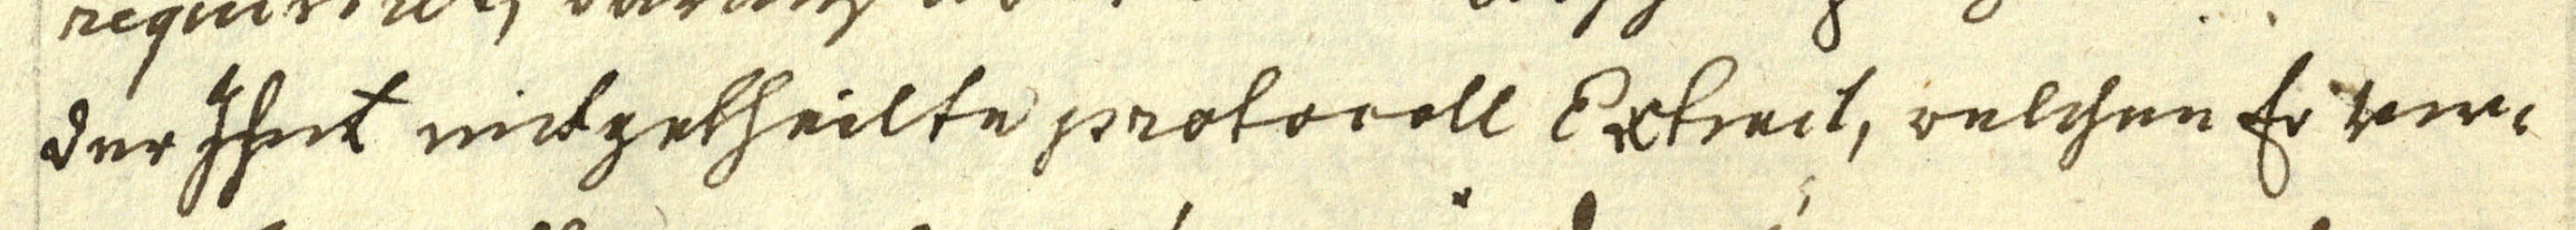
der Ihm mitgetheilte protocoll Extract, welchen Er ver¬
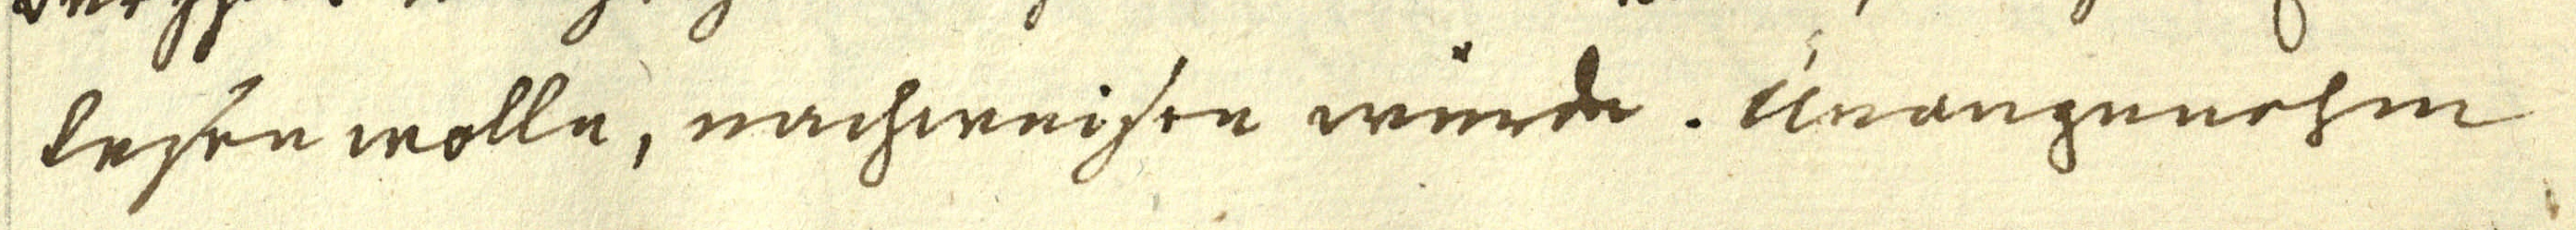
lesen wolle, nachweisen würde. Unangenehm
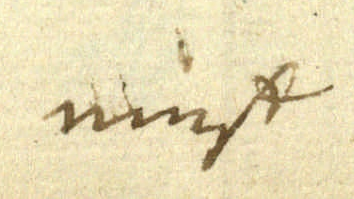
ist
